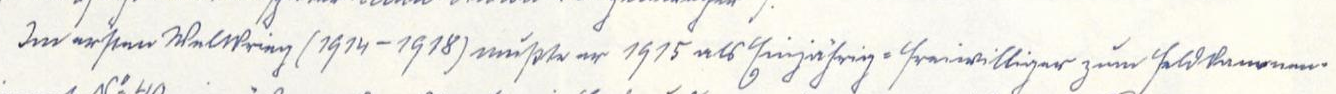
Im ersten Weltkrieg (1914-1918) musste er 1915 als Einjährig – Freiwilliger zum Feldkanonen-
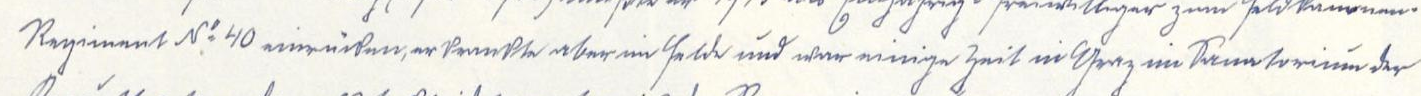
Regiment No 40 einrücken, erkrankte aber im Felde und war einige Zeit in Graz im Sanatorium der
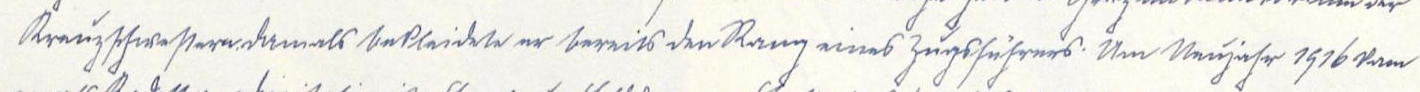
Kreuzschwestern. Damals bekleidete er bereits den Rang eines Zugsführers. Um Neujahr 1916 kam
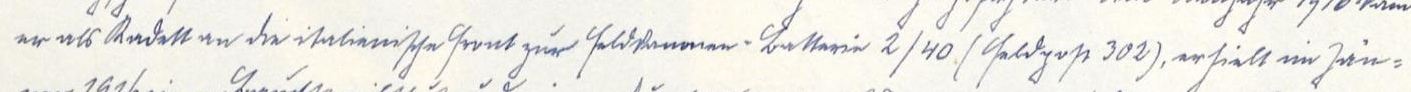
er als Kadett an die italienische Front zur Feldkanonen-Batterie 2/40 (Feldpost 302), erhielt im Jän-
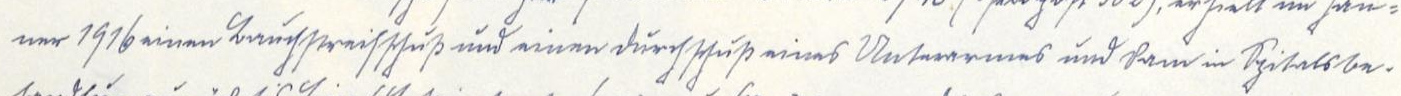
ner 1916 einen Bauchstreifschuß und einen Durchschuß eines Unterarmes und kam in Spitalsbe-
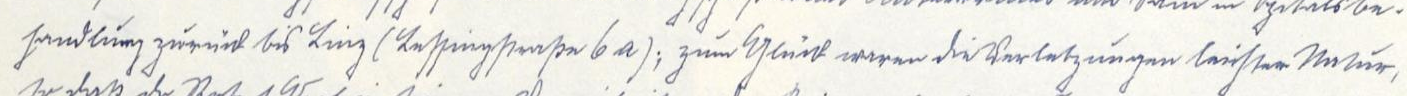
handlung. zurück bis Linz (Lessingstraße 6a); zum Glück waren die Verletzungen leichter Natur,
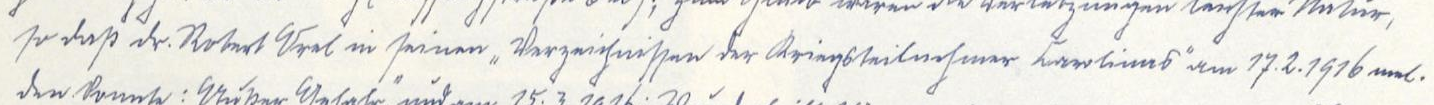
so daß Dr. Robert Orel in seinen „Verzeichnissen der Kriegsteilnehmer Carolinas“ am 17. 2. 1916 mel-
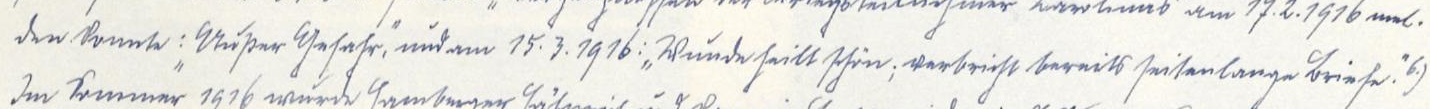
den konnte : „Außer Gefahr“ und am 15. 3. 1916: „Wunde heilt schön, verbricht bereits seitenlange Briefe“ 6)
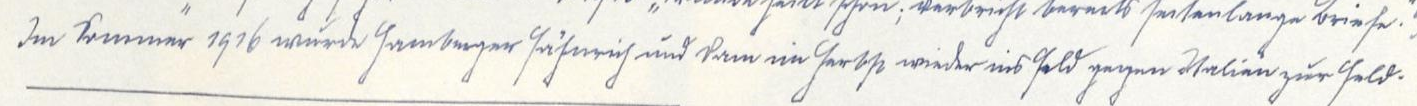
Im Sommer 1916 wurde Hamberger Fähnrich und kam im Herbst wieder ins Feld gegen Italien zur Feld-
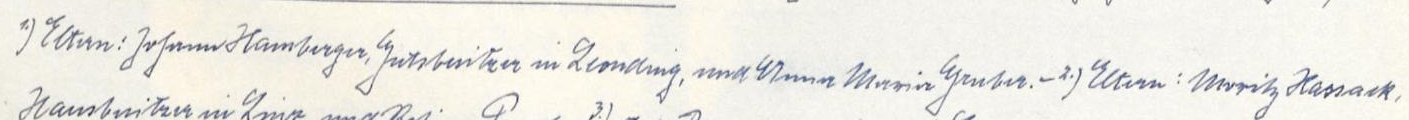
1) Eltern; Johann Hamberger, Gutsbesitzer in Leonding, und Anna Maria Gruber.- 2) Eltern Moritz Hassack,
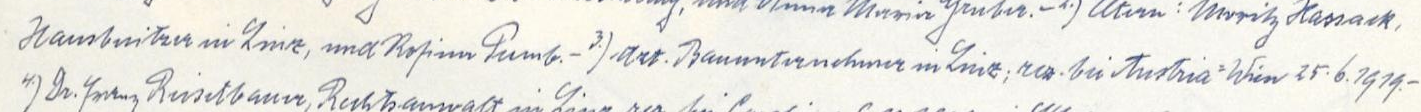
Hausbesitzer in Linz und Rosina Pumb.- 3) Art. Bauunternehmer in Linz, rez. bei Austria-Wien 25.6.1919.-
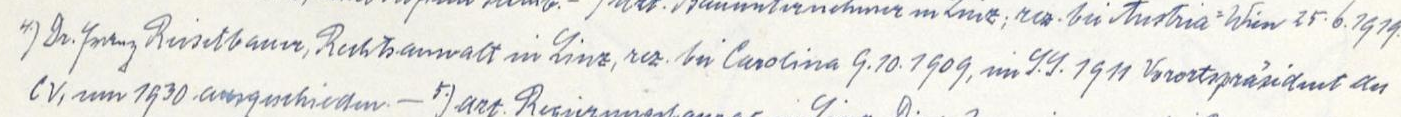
4) Dr. Franz Reiselbauer, Rechtsanwalt in Linz, rez. bei Carolina 9.10. 1909 im SS 1911 Vorortspräsident der
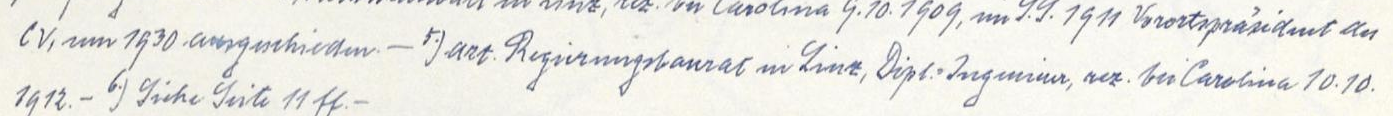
CV um 1930 ausgeschieden.- 5) Art. Regierungsbaurat in Linz, Dipl. Ingenieur, rez. bei Carolina 10.10.
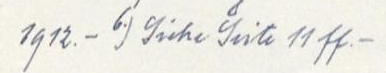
1912.- 6) Seihe Seite 11 ff .-
